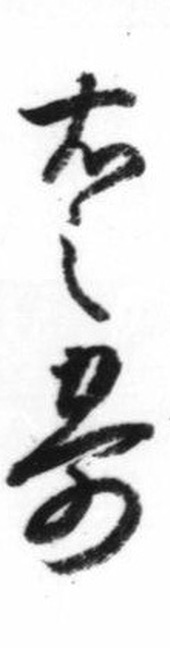右之寄
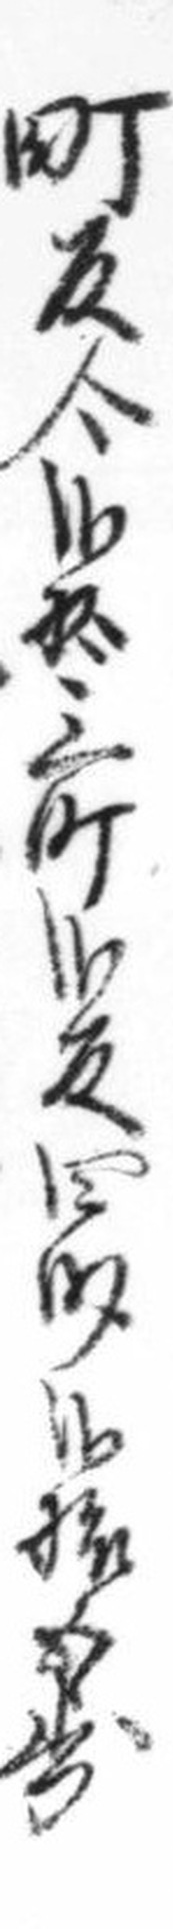町反合弐拾三町弐反四畝弐拾五歩
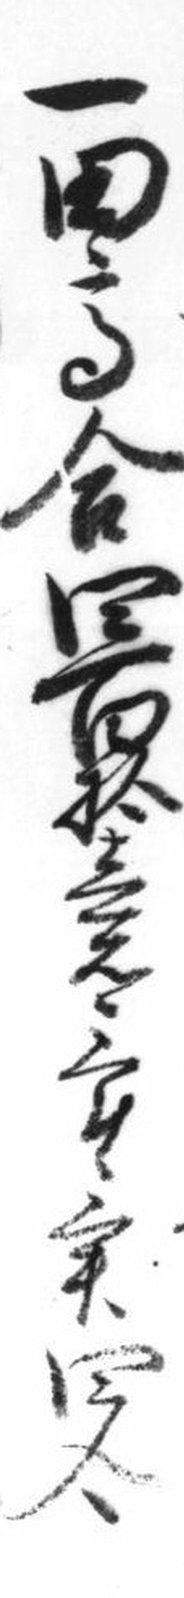一田高合四百拾壱石三斗三升四合
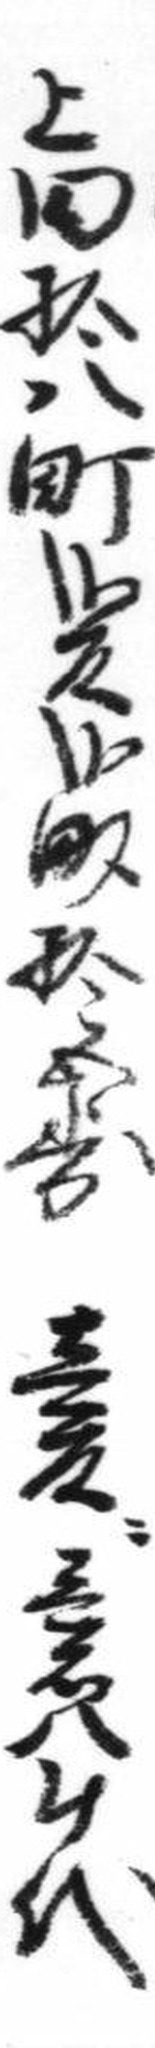上田拾八町弐反弐畝拾五歩壱反二壱石八斗代
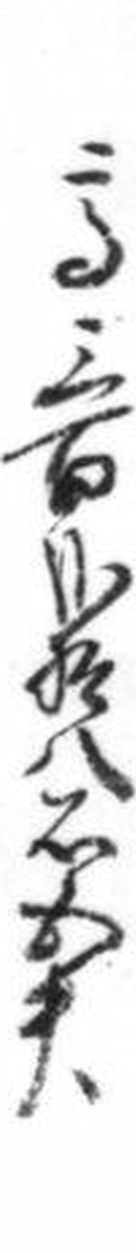高三百弐拾八石五升
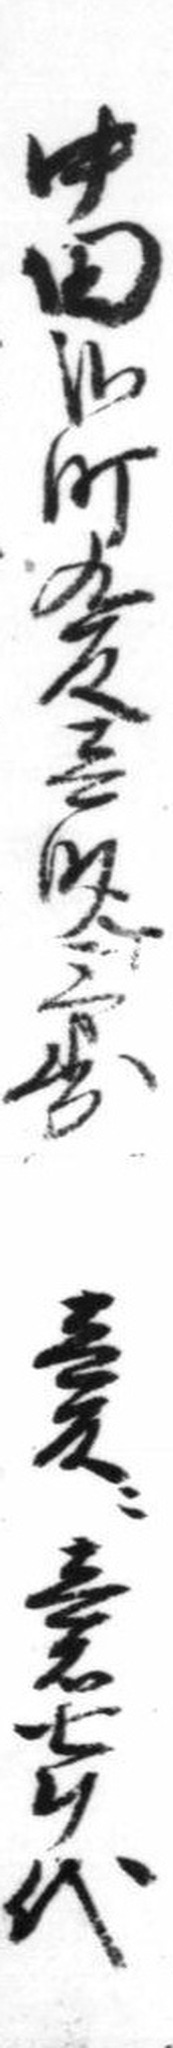中田弐町九反壱畝三歩壱反二壱石七斗代
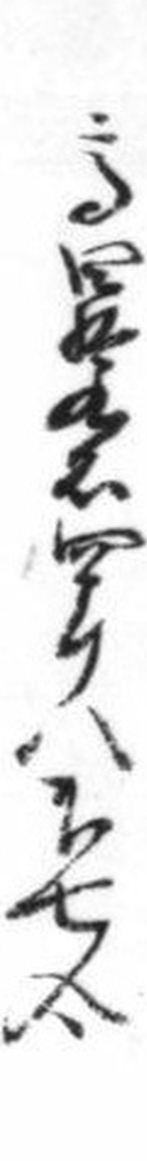高四拾九石四斗八升七合
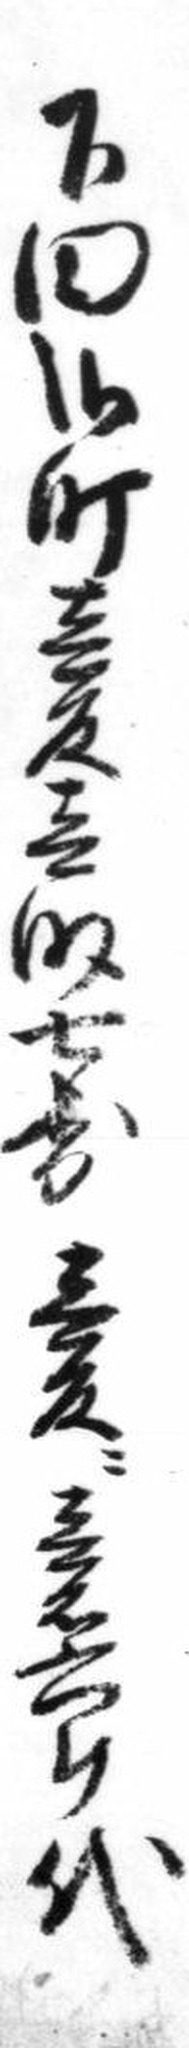下田弐町壱反壱畝七歩壱反二壱石六斗代
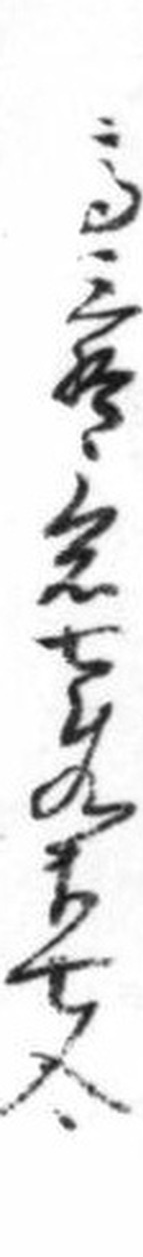高三拾三石七斗九升七合

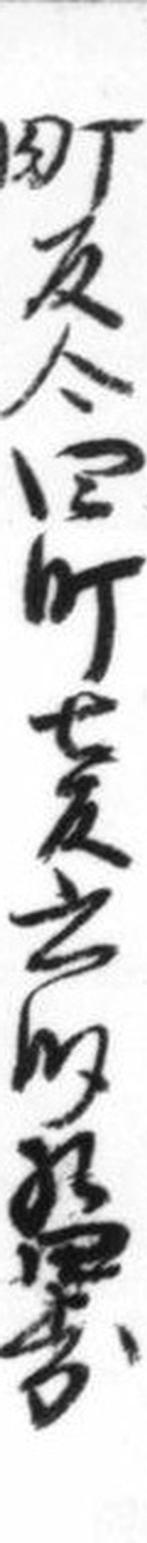町反合四町七反六畝拾四歩
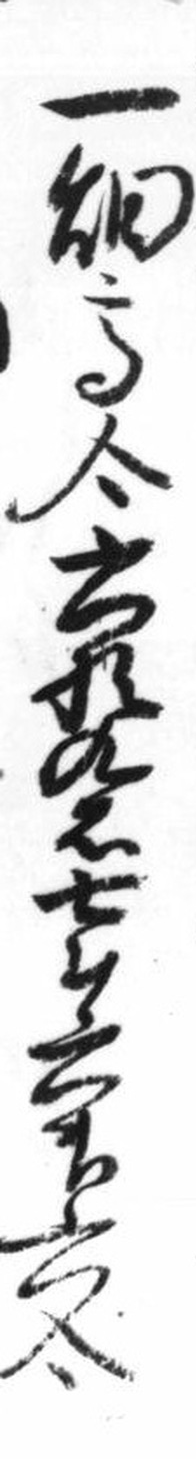一畑高合六拾九石七斗六升六合
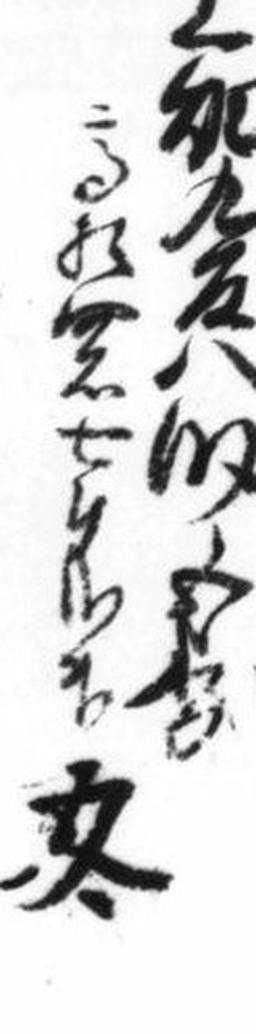高拾四石七斗弐升五合
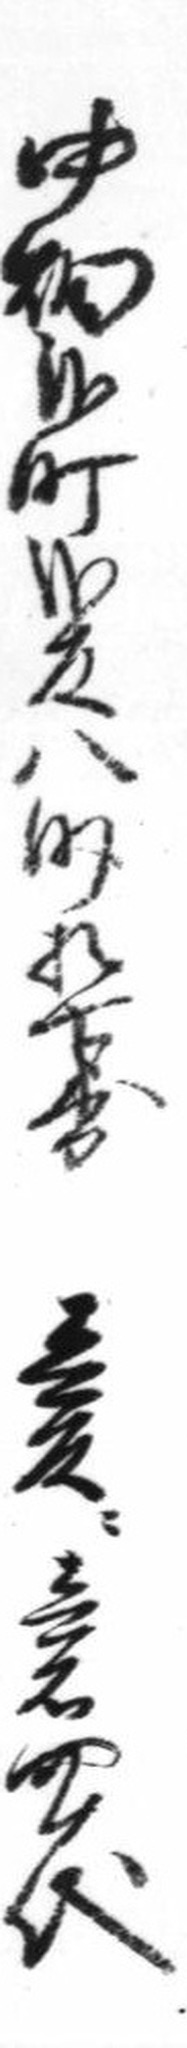中畑弐町弐反八畝拾七歩壱反二壱石四斗代
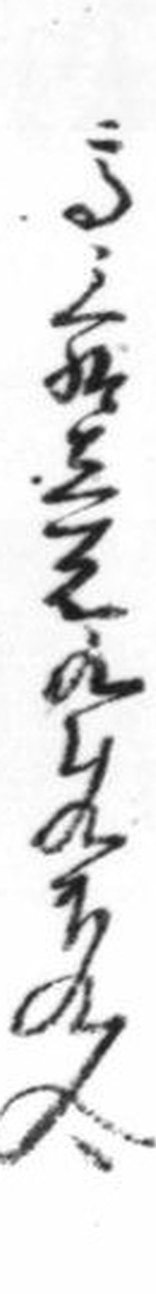高三拾壱石九斗九升九合
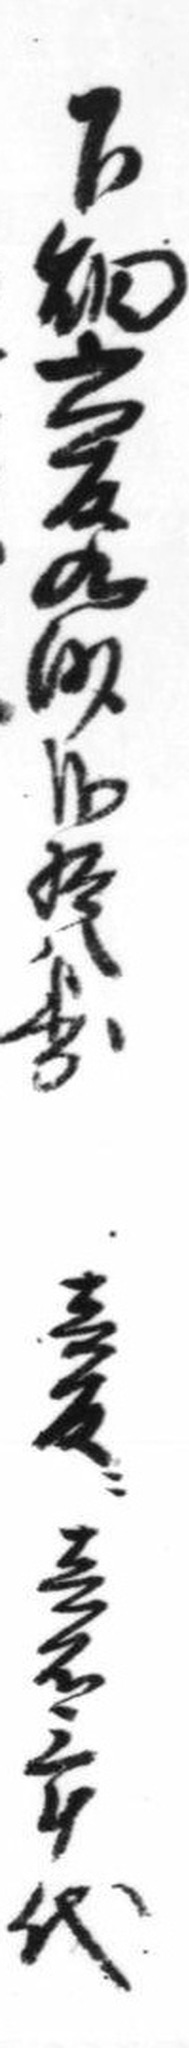下畑六反九畝弐拾八歩壱反二壱石三斗代
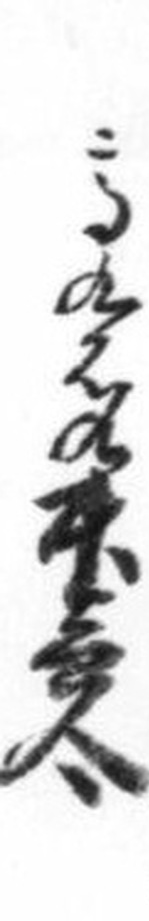高九石九升壱合
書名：越前国大野郡今井村御検地帳
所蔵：福井県文書館 Fukui Prefectural Archives
